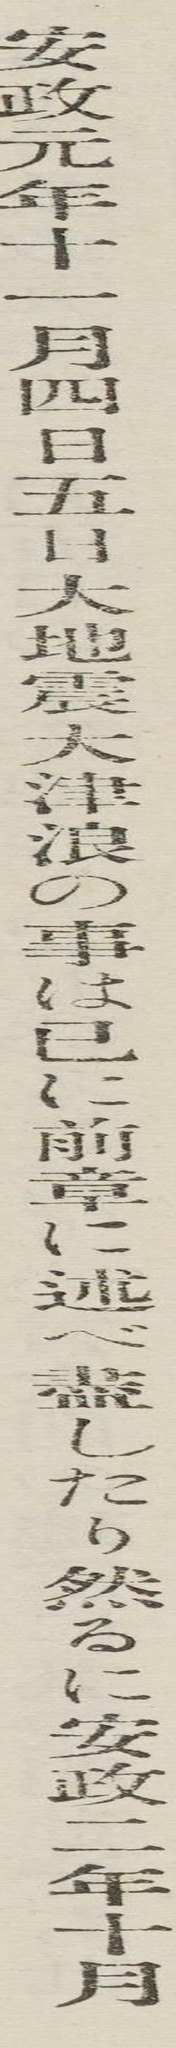安政元年十一月四日五日大地震大津浪の事は已に前章に述べ盡したり然るに安政二年十月
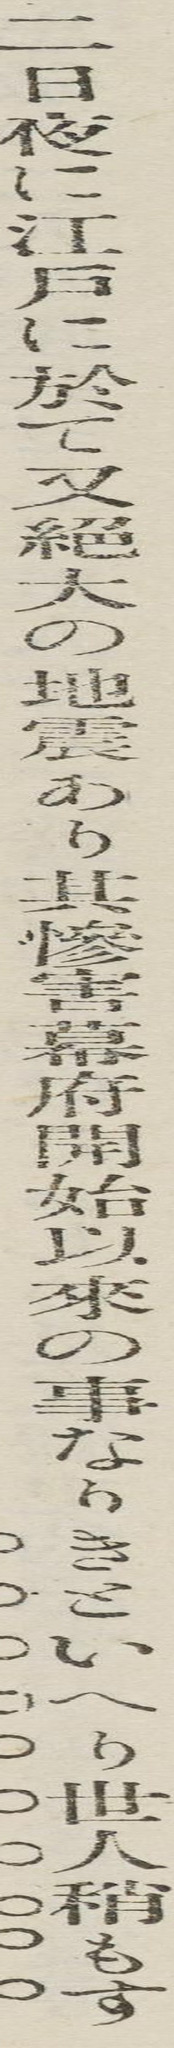二日夜に江戸に於て又絶大の地震あり其惨害幕府開始以来の事なりきといへり世人稍もす
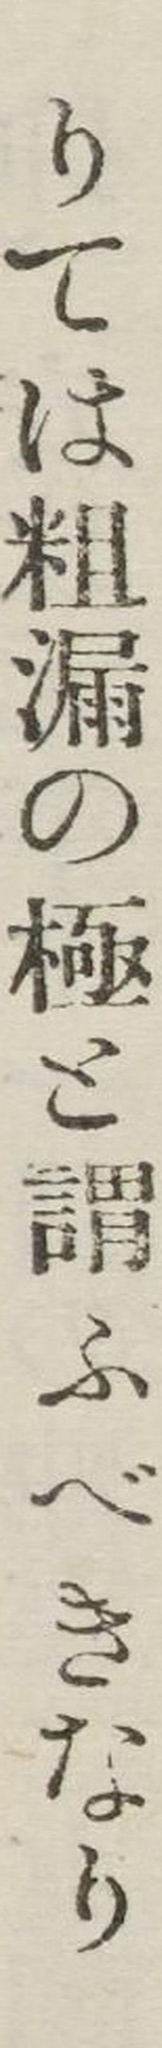りては粗漏の極と謂ふべきなり

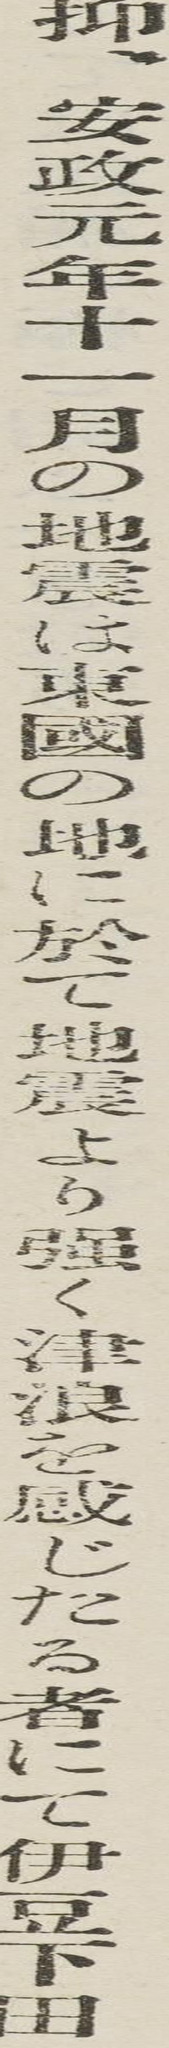抑、安政元年十一月の地震は東国の地に於て地震より強く津浪を感じたる者にて伊豆下田
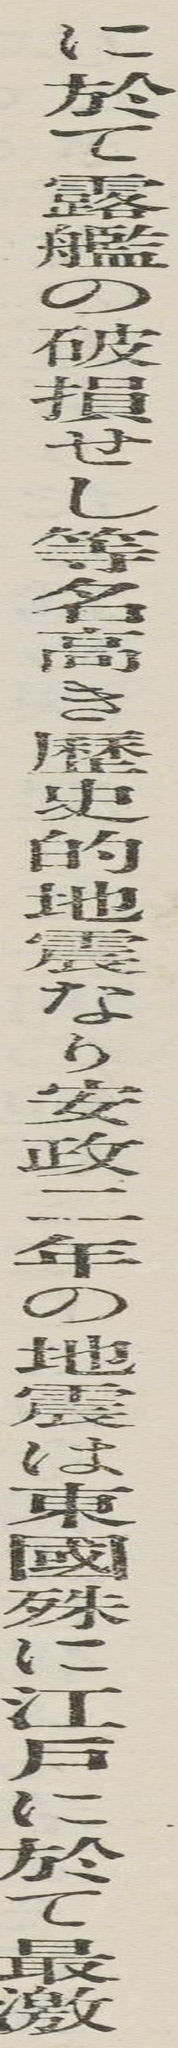に於て露艦の破損せし等名高き歴史的地震なり安政二年の地震は東国殊に江戸に於て最激
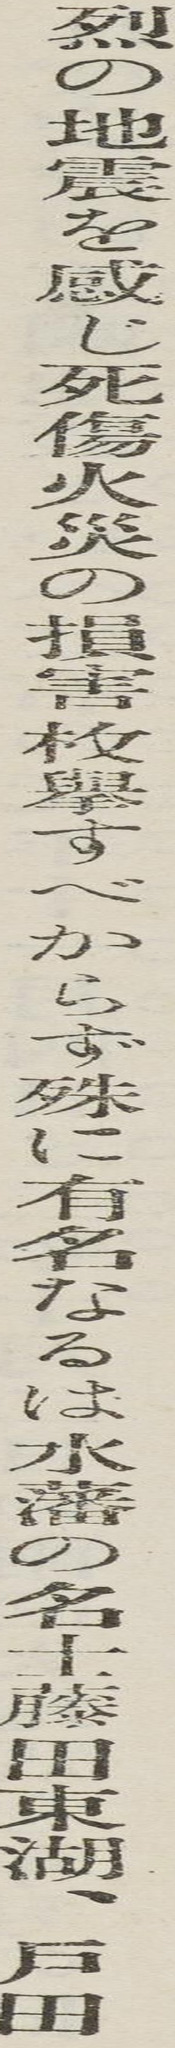烈の地震を感じ死傷火災の損害枚挙すべからず殊に有名なる水藩の名士藤田東湖、戸田
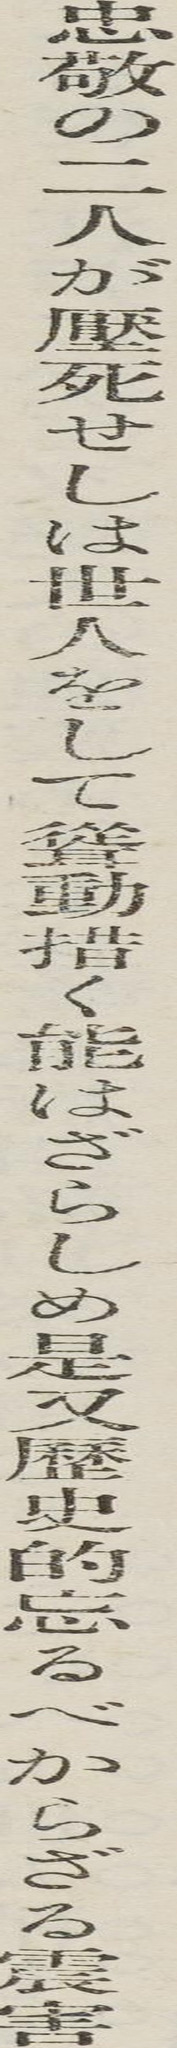忠敬の二人が圧死せしは世人をして聳動惜く能はざらしめ是又歴史的忘るべからざる震害
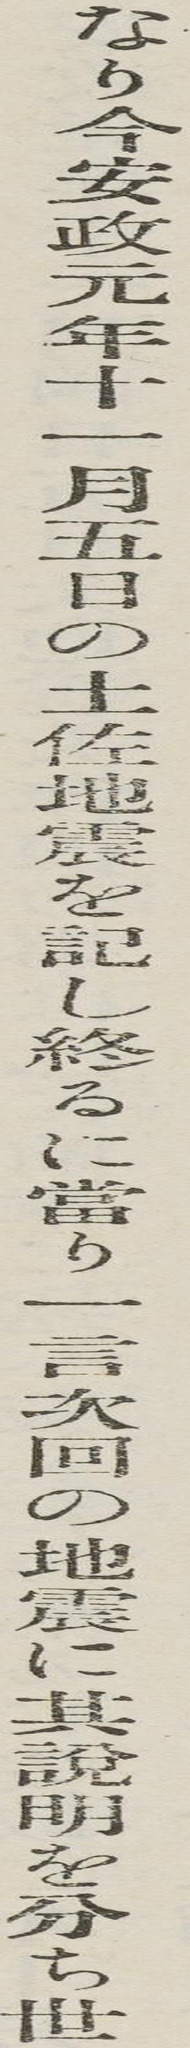なり今安政元年十一月五日の土佐地震を記し終るに当り一言次回の地震に其説明を分ち世
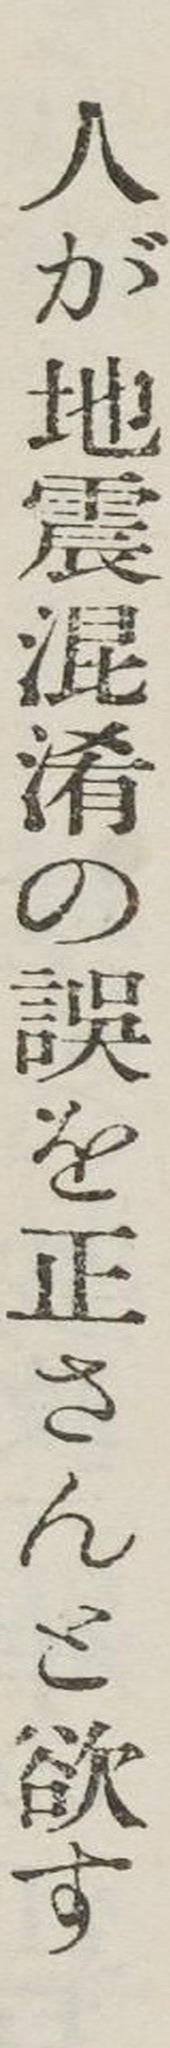人が地震混淆の誤を正さんと欲す
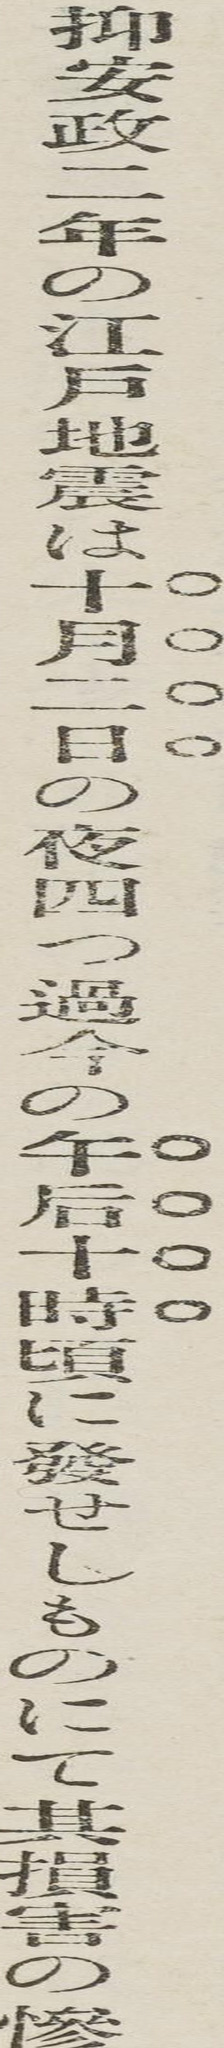抑安政二年の江戸地震は十月二日の夜四ツ過今の午后十時頃に発せしものにて其損害の惨
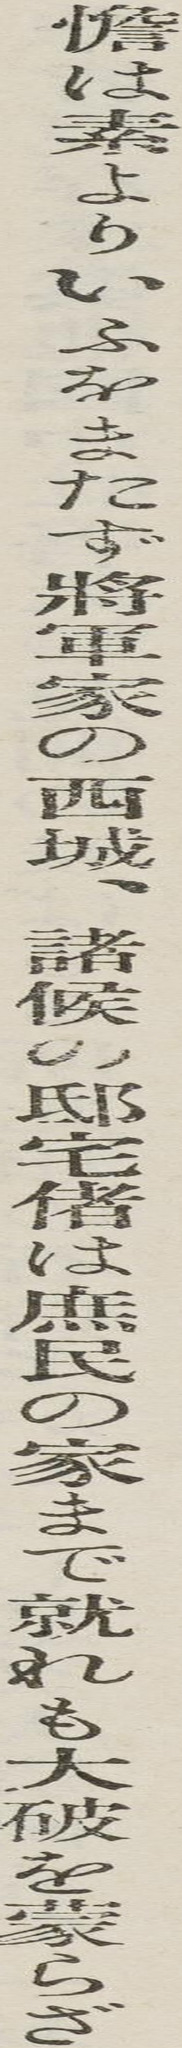憺は素よりいふをまたず将軍家の西城、諸侯の邸宅偖は庶民の家まで就れも大破を蒙らざ
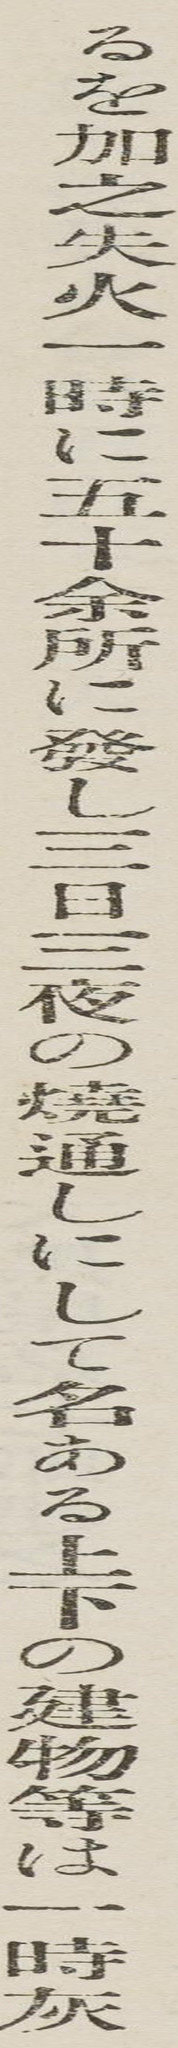るを加之失火一時に五十余所に発し三日三夜の焼通しにして名ある上下の建物等は一時灰
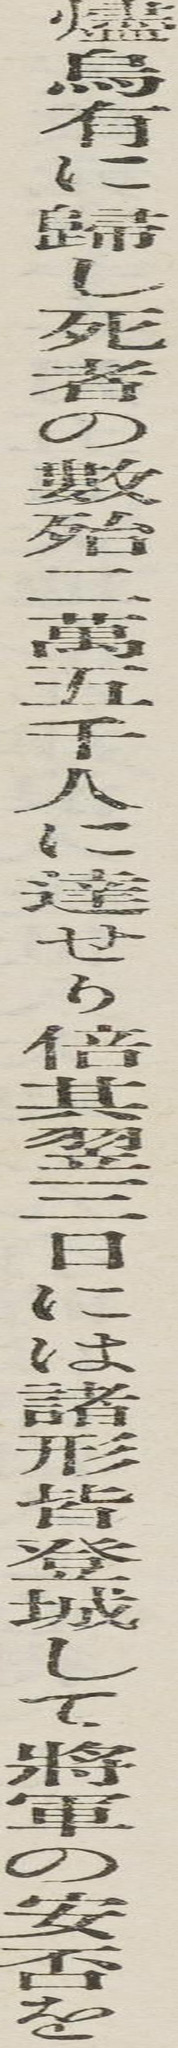燼鳥有に帰し死者の数殆二万五千人に達せり倍其翌三日には緒形皆登城して将軍の安否を
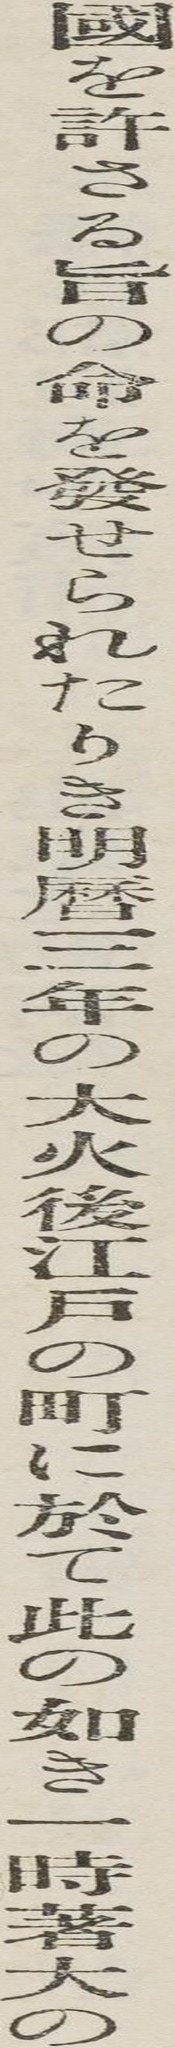国を許さる旨の命を発せられたりき明暦三年の大火後江戸の町に於て此の如き一時著大の
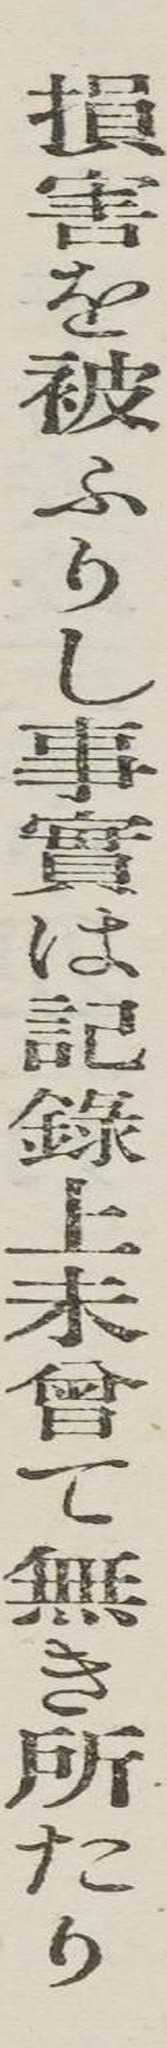損害を被ふりし事実は記録上未曾て無き所たり
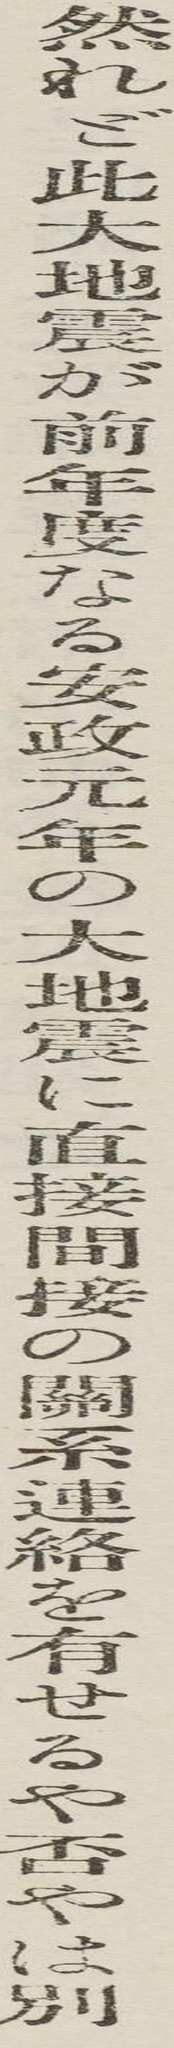然れど此大地震が前年度なる安政元年の大地震に直接間接の関系連絡を有せるや否やは別
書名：土佐古今ノ地震
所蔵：東京大学地震研究所図書室 Earthquake Research Institute Library, The University of Tokyo, JAPAN
